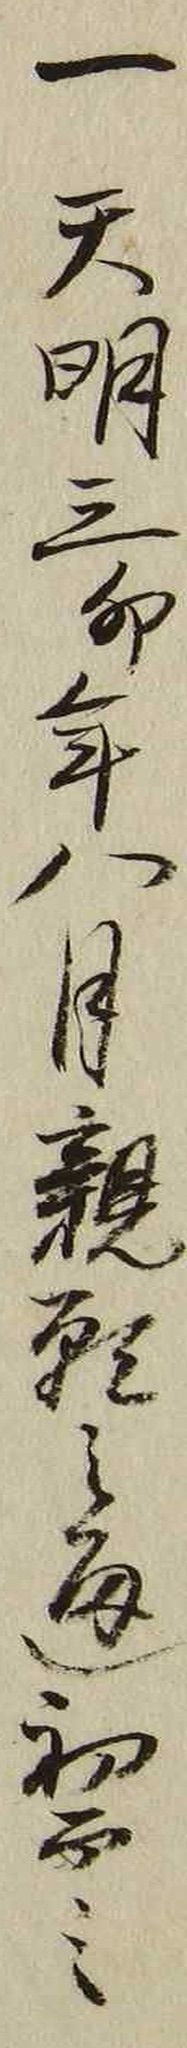一天明三卯年八月親願之通初而之
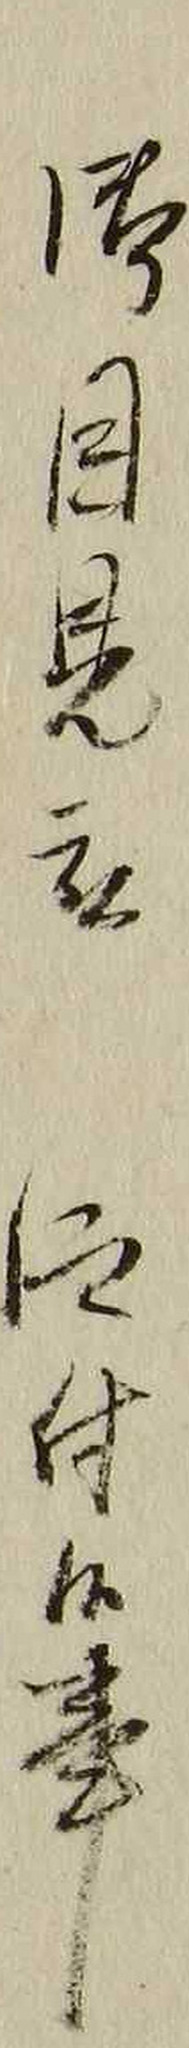御目見被仰付候事
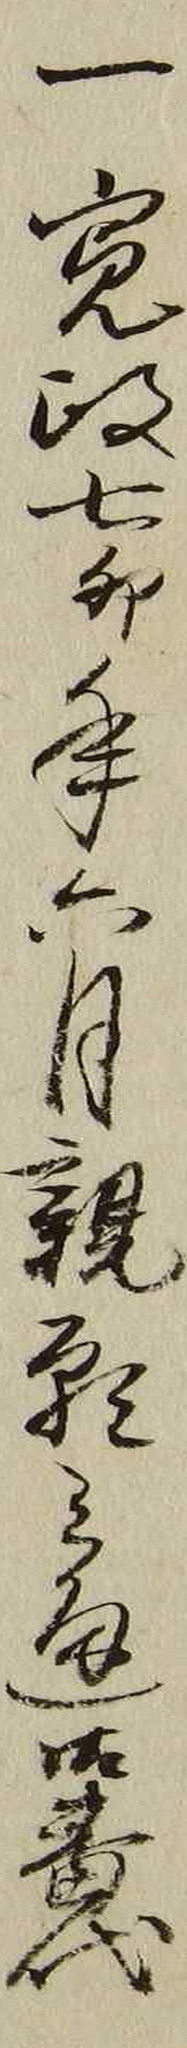一寛政七卯年六月親願之通御番代
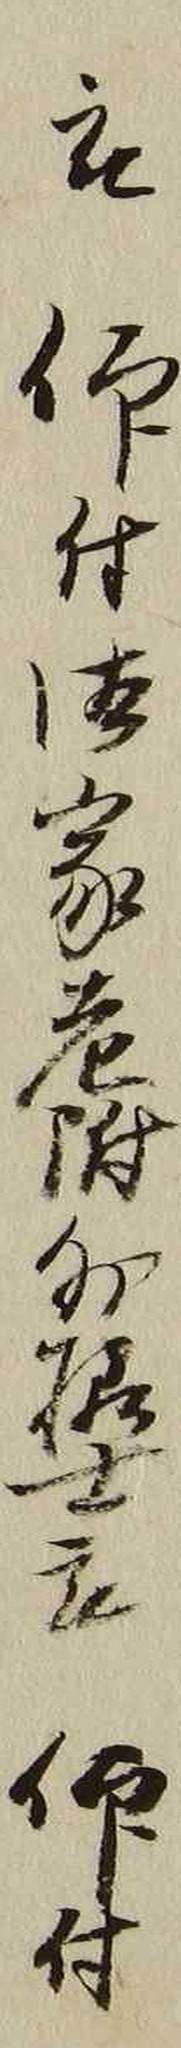被仰付御家老附外様士被仰付
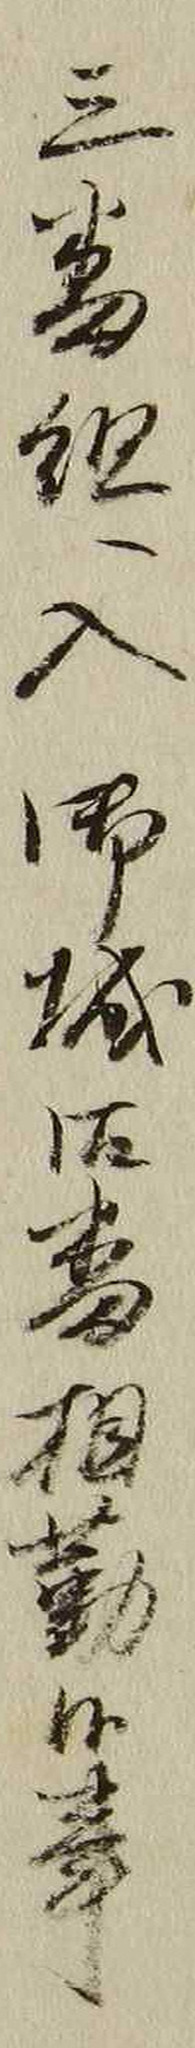三番組へ入御城御番相勤候事
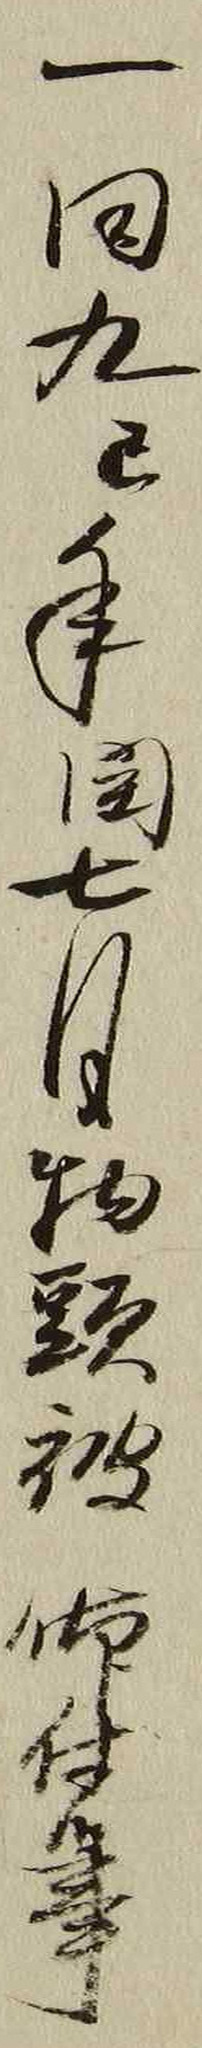一同九巳年閏七月物頭被仰付候事
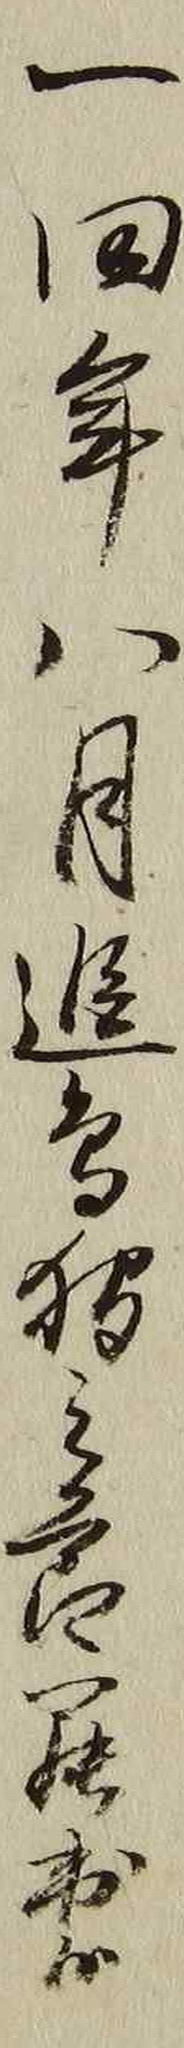一同年八月追鳥狩之節罷出候
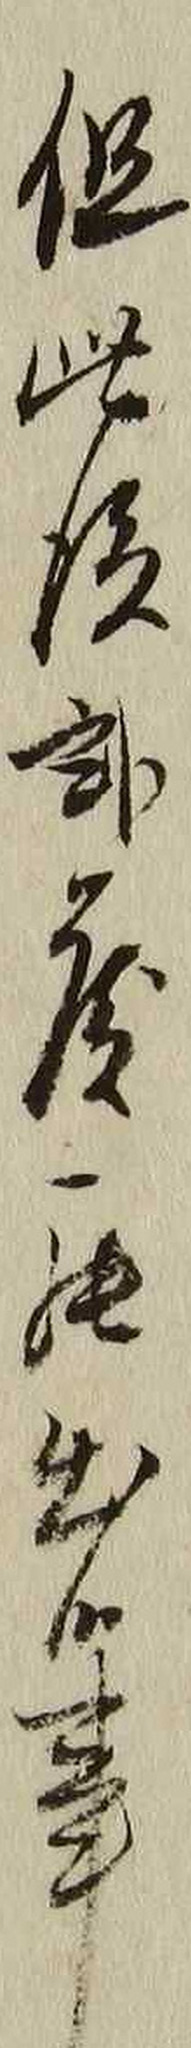但此後弐度罷出候事
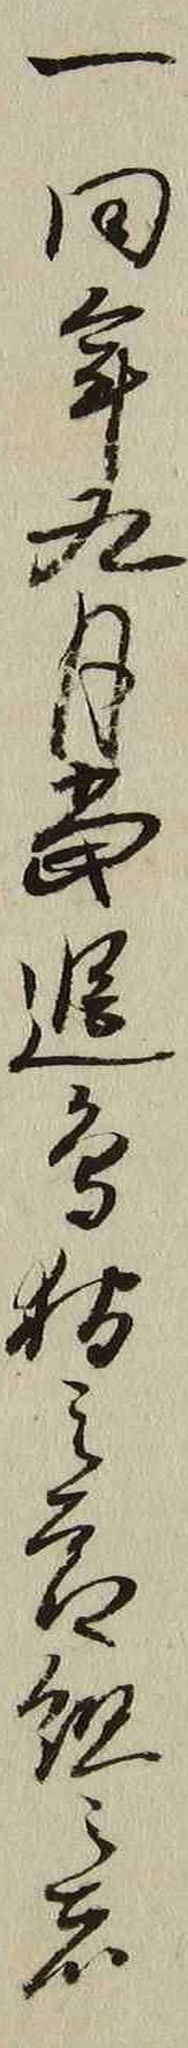一同年九月当追鳥狩之節組之者
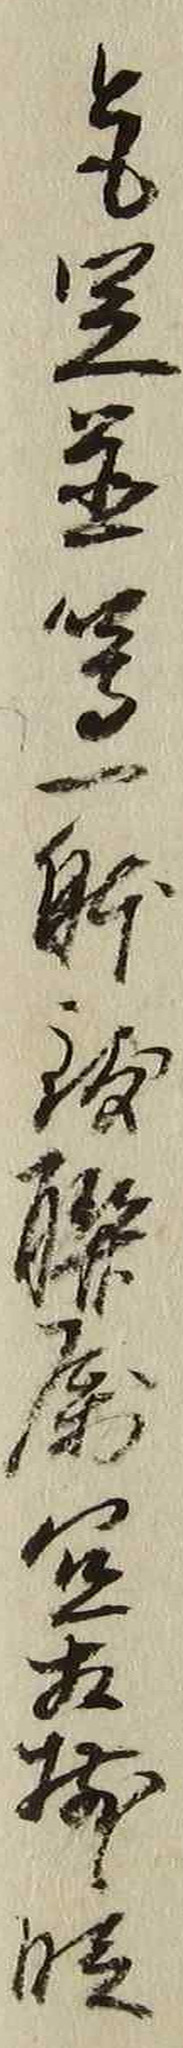とも足並等一体致聯属宜相揃候段
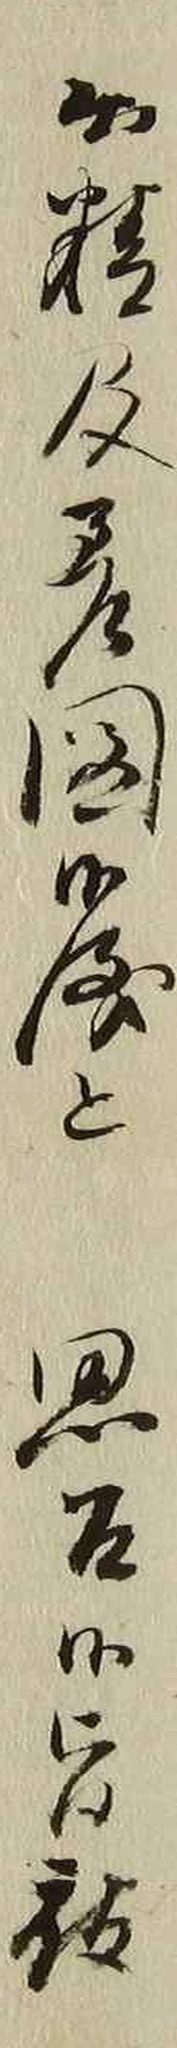出精及差図候儀と思召候旨被
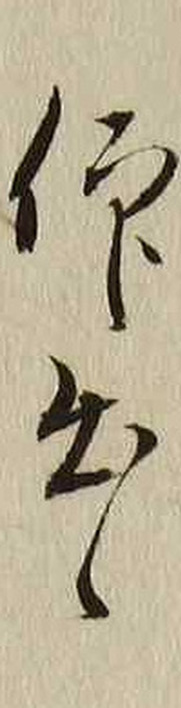仰出候
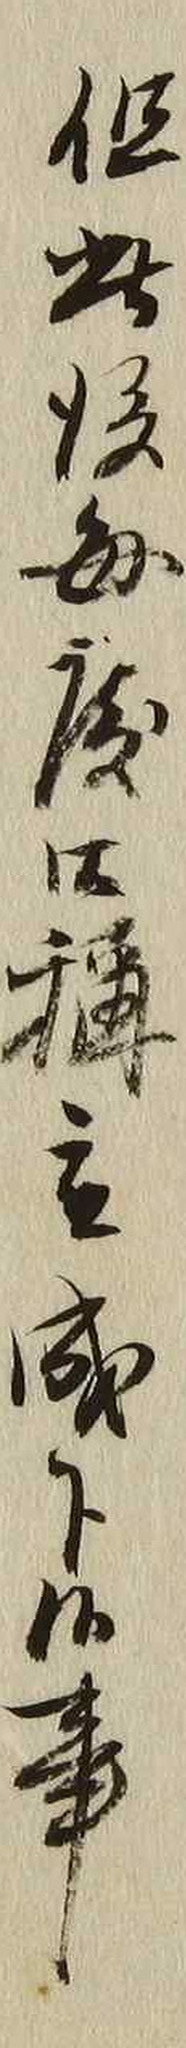但此後毎度御称被成下候事
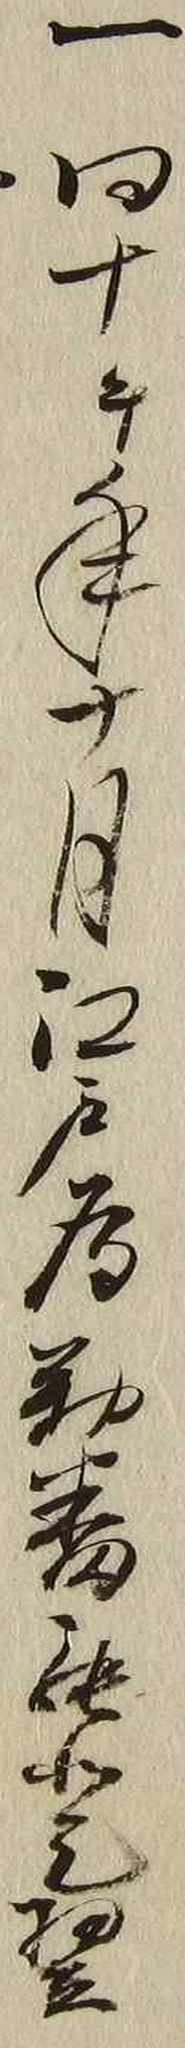一同十午年十月江戸為勤番罷登翌
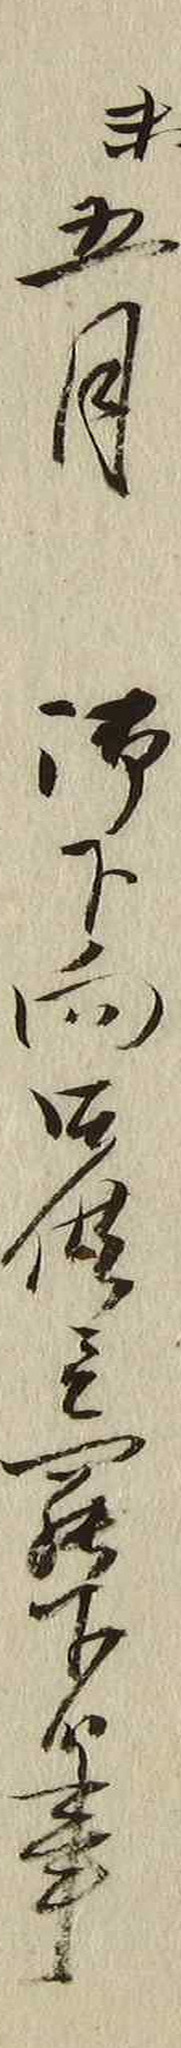未五月御下向御供ニ而罷下候事
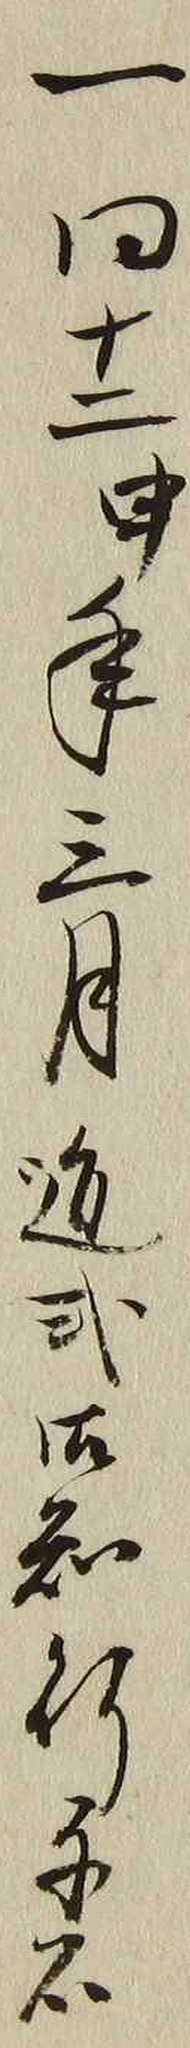一同十二申年三月跡式御知行千石
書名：諸士系譜　巻之351　す之部1
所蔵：会津若松市立会津図書館
